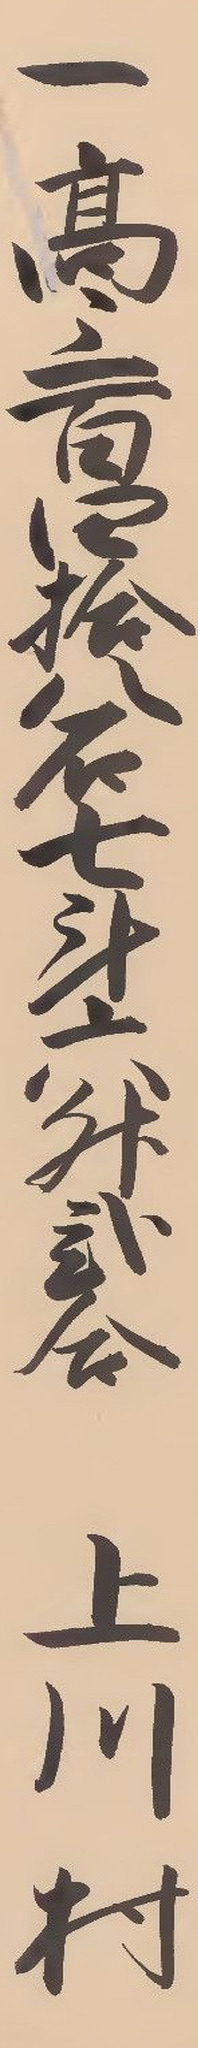一高三百四拾八石七斗六升弐合上川村

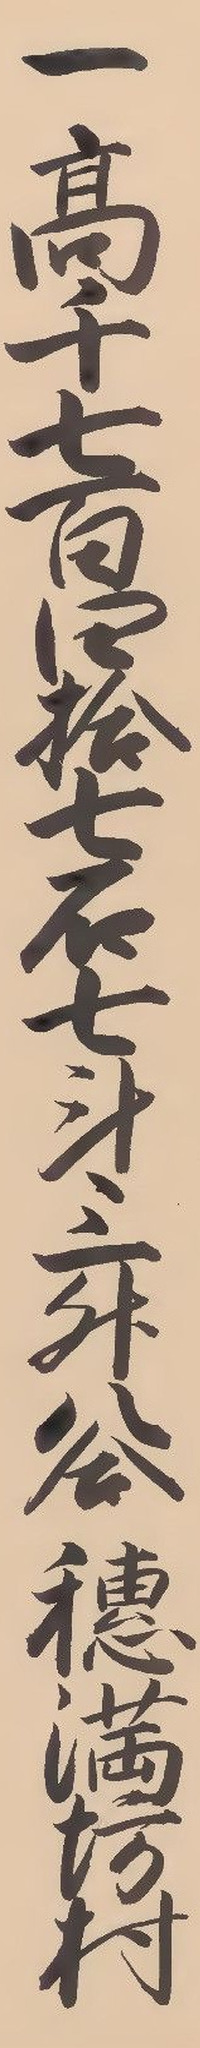一高千七百四拾七石七斗三升八合穂満坊村
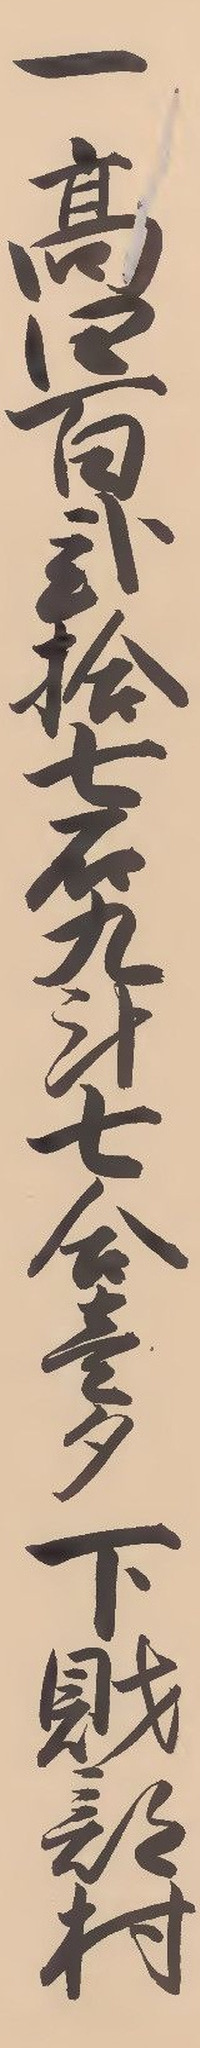一高四百弐拾七石九斗七合壱勺下財部村
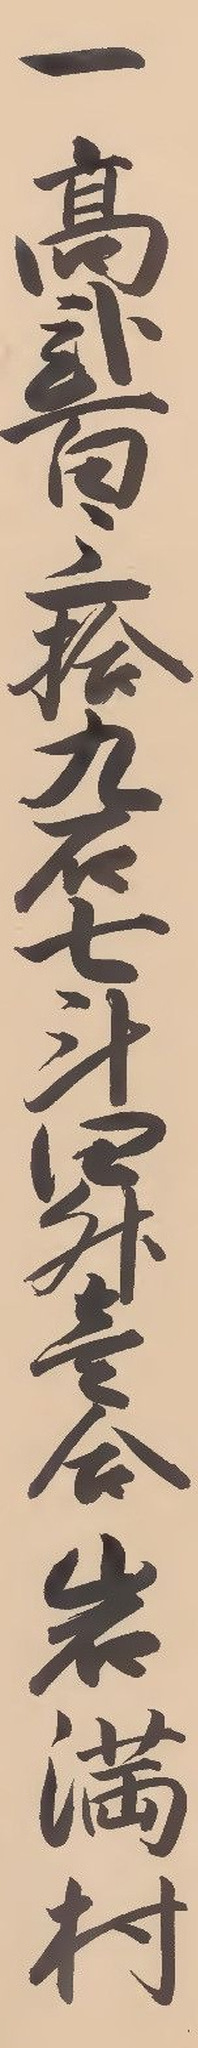一高弐百三拾九石七斗四升壱合岩満村
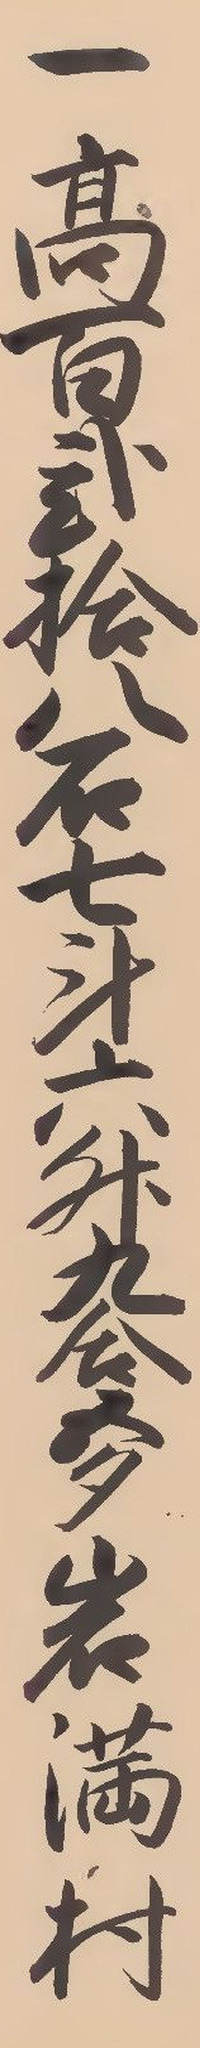一高百弐拾八石七斗六升九合五勺岩満村
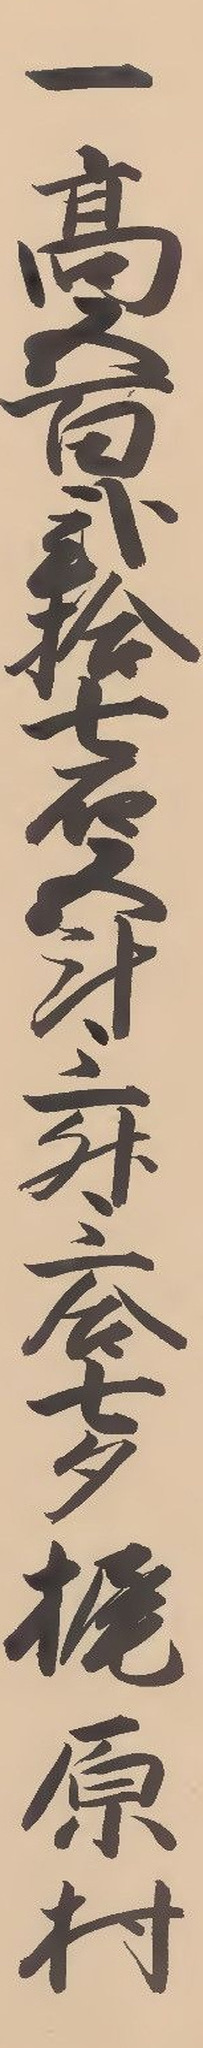一高五百弐拾七石五斗三升三合七勺梶原村
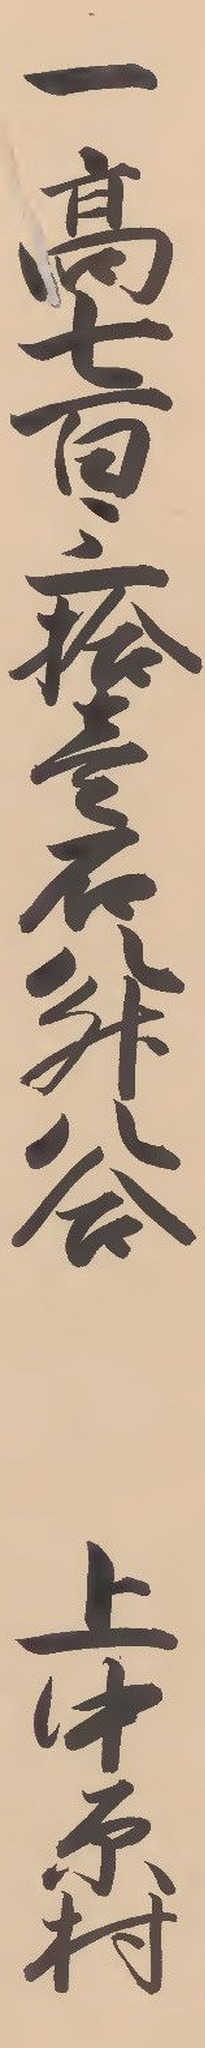一高七百三拾壱石八升八合上中原村
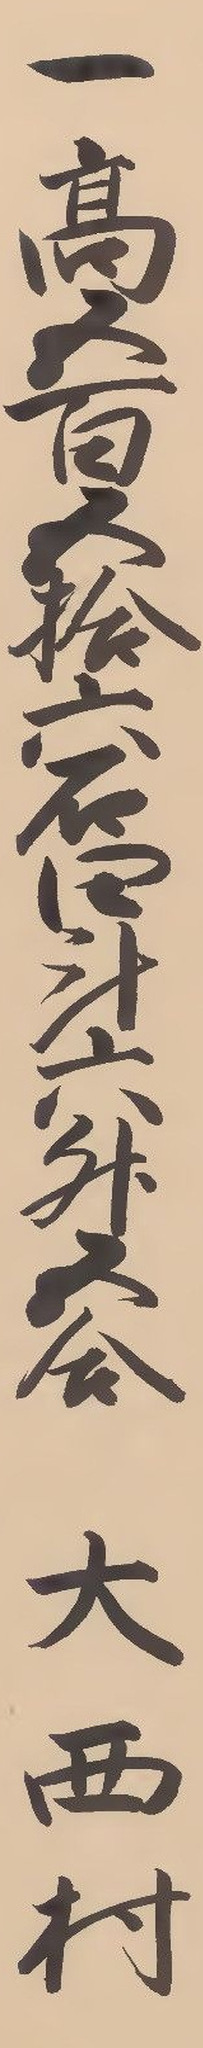一高五百五拾六石四斗六升五合大西村

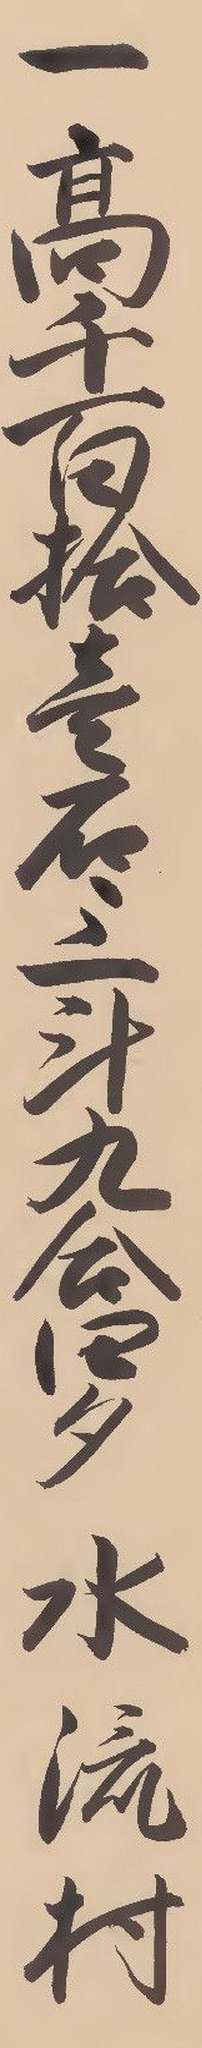一高千百拾壱石三斗九合四勺水流村
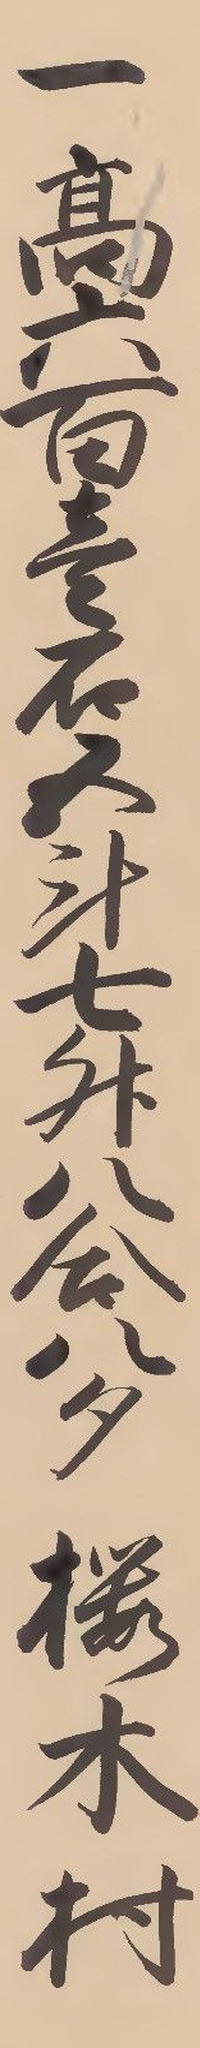一高六百壱石五斗七升八合八勺桜木村
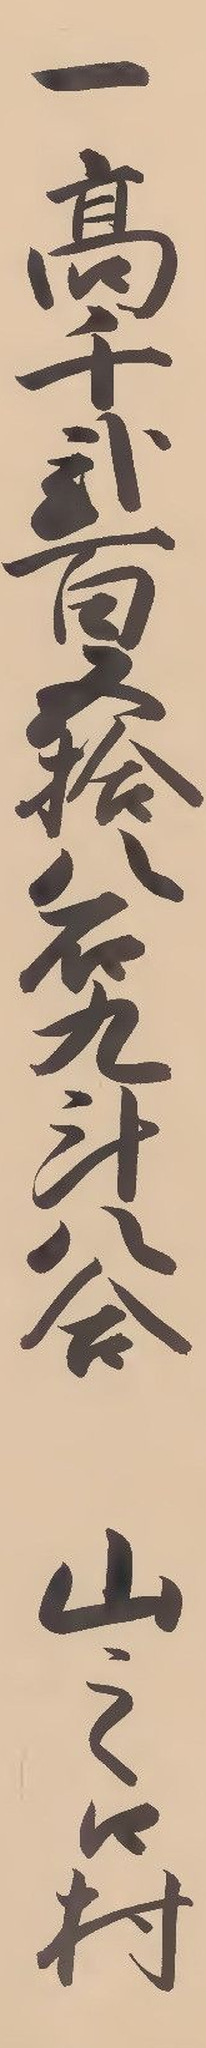一高千弐百五拾八石九斗八合山之口村
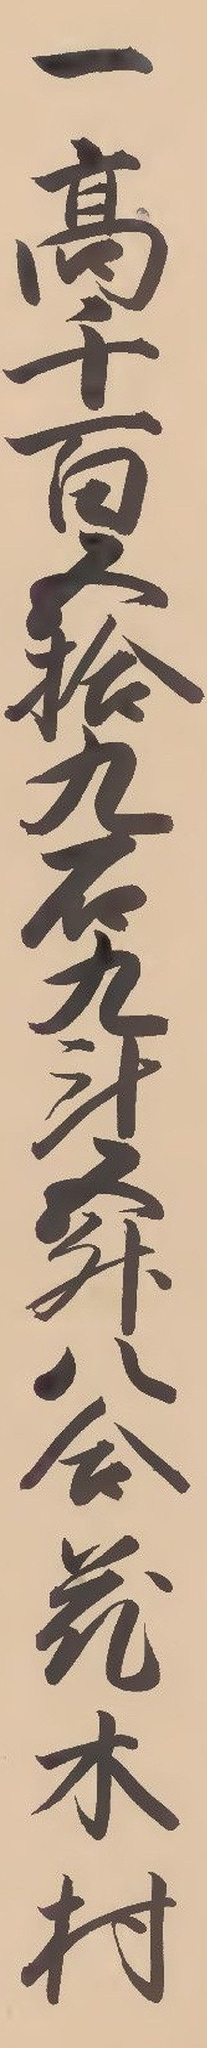一高千百五拾九石九斗五升八合花木村
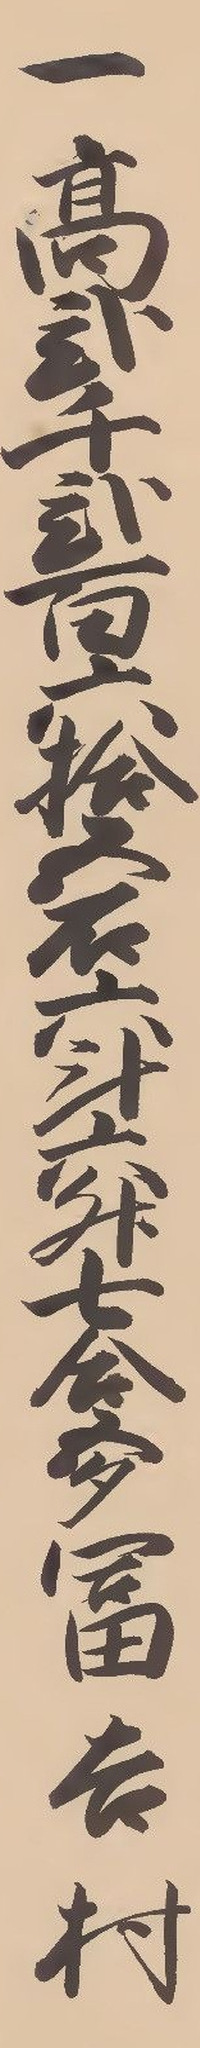一高弐千弐百六拾五石六斗六升七合五勺富吉村
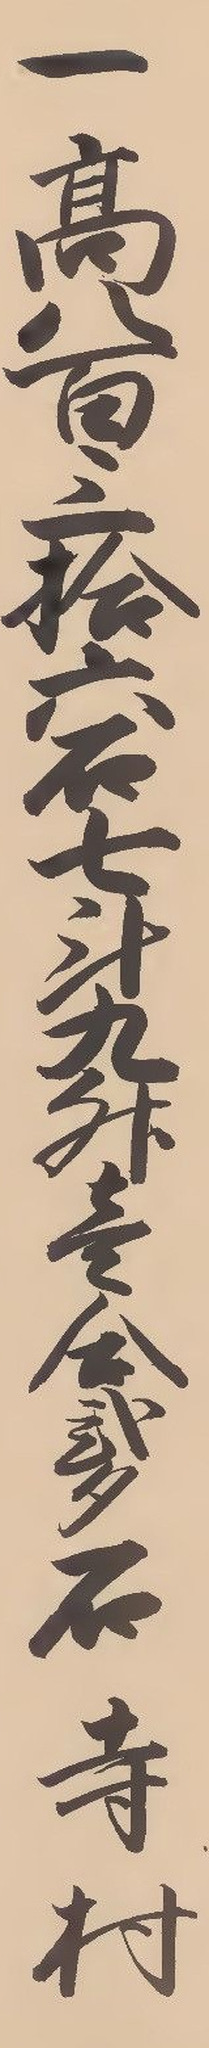一高八百三拾六石七斗九升壱合弐勺石寺村
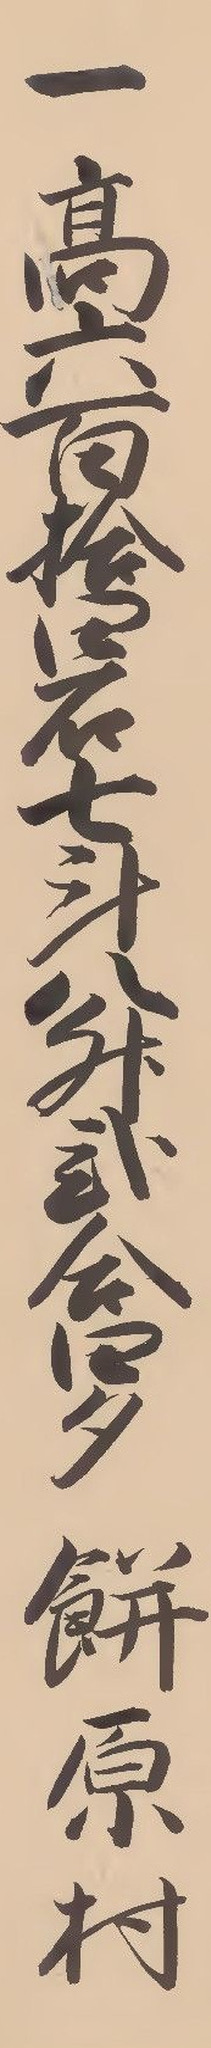一高六百拾四石七斗八升弐合四勺餅原村
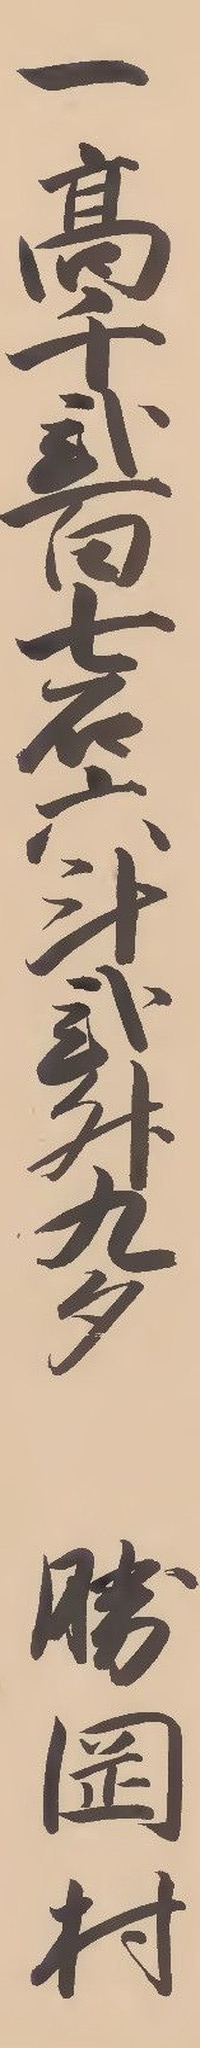一高千弐百七石六斗弐升九勺勝岡村
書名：日向国郷帳
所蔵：国立公文書館 National Archives of Japan
